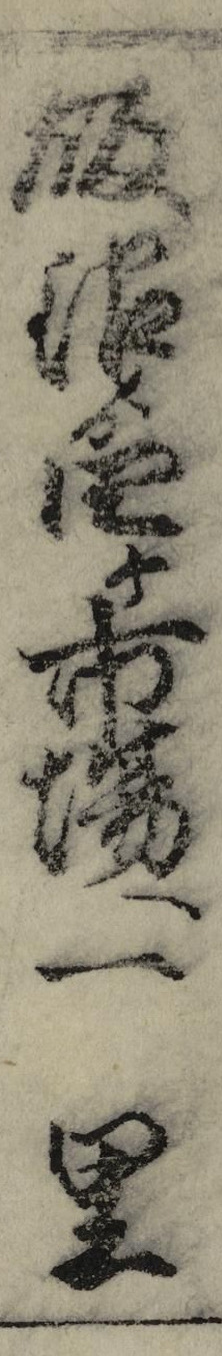飯沼ゟ四ヶ市場へ一里
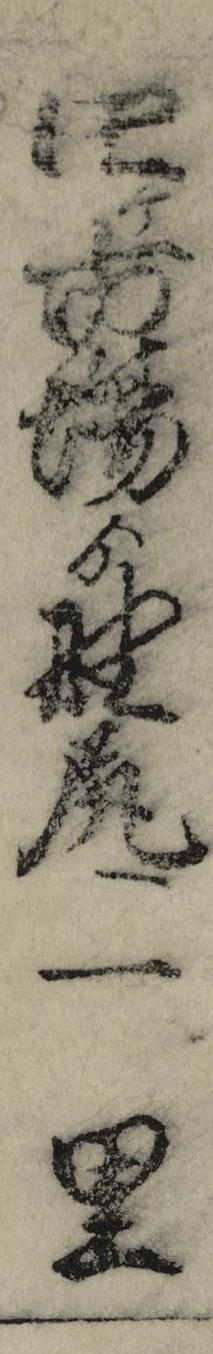四ヶ市場ゟ野尻へ一里
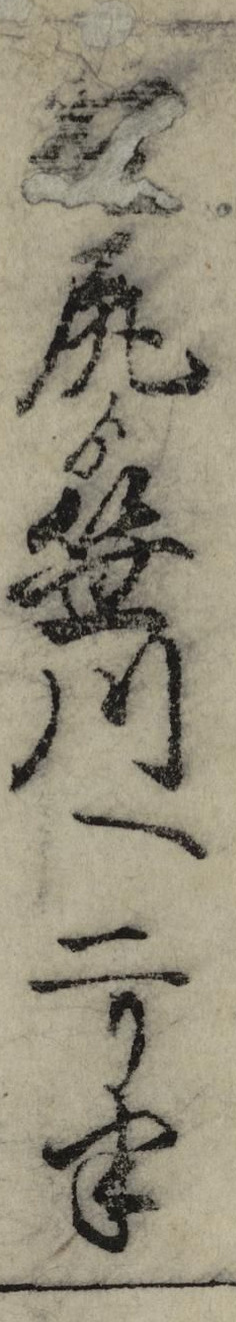野尻ゟ笹川へ二リ半
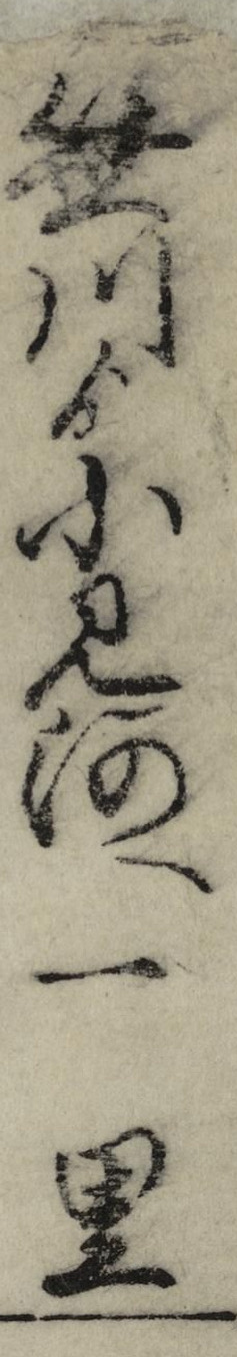笹川ゟ小見河へ一里
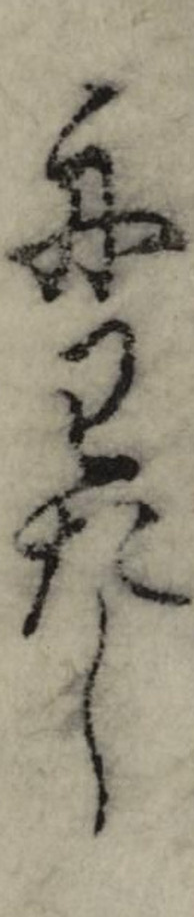舟わたし
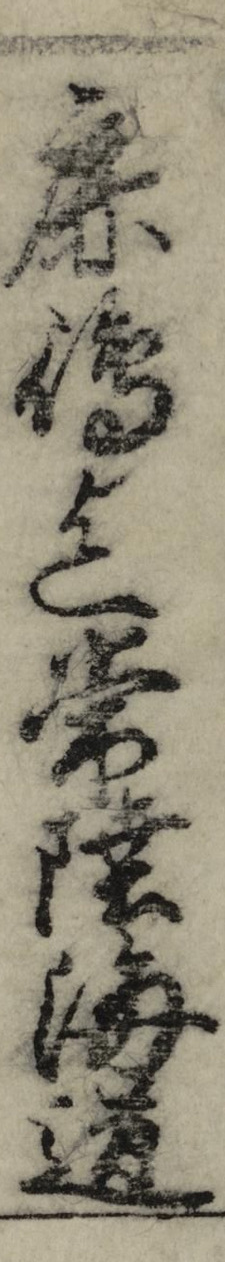鹿島迄常陸海道
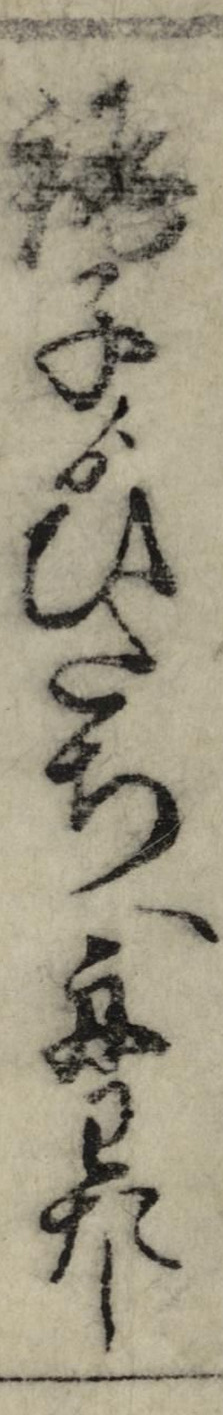銚子ゟひたちへ舟わたし
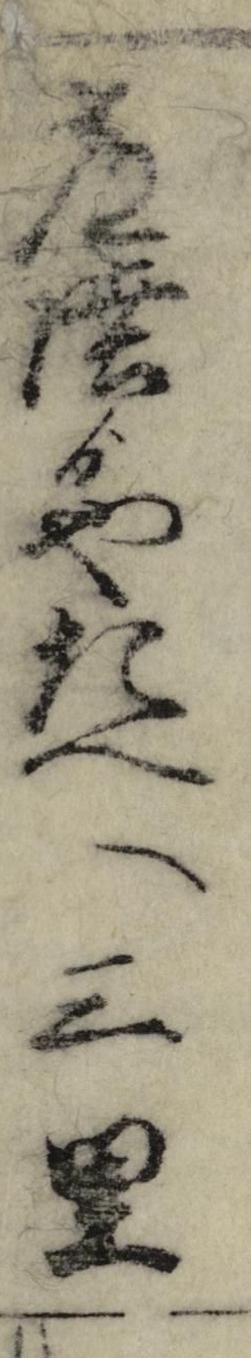常陸ゟやたへへ三里
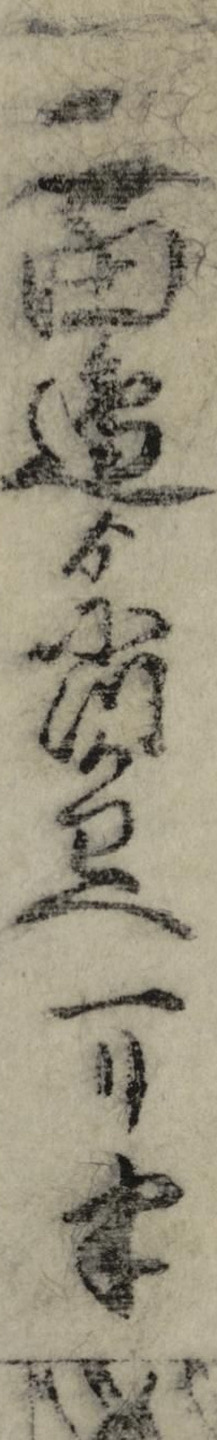田辺ゟにつかわへ一リ半
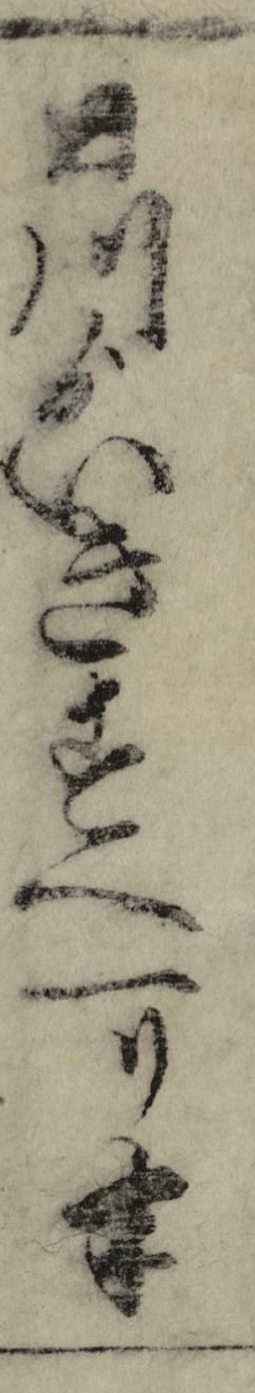日川ゟいきすへ一リ半
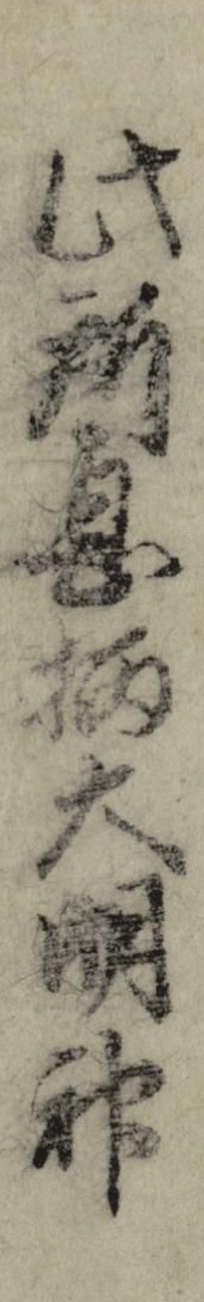此所息栖大明神
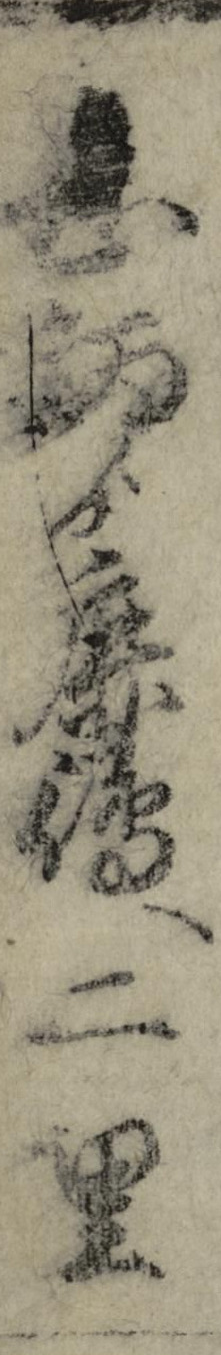息栖ゟ鹿島へ二里
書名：下総銚子之圖并磯案内名所附
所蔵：東京大学地震研究所図書室 Earthquake Research Institute Library, The University of Tokyo, JAPAN
